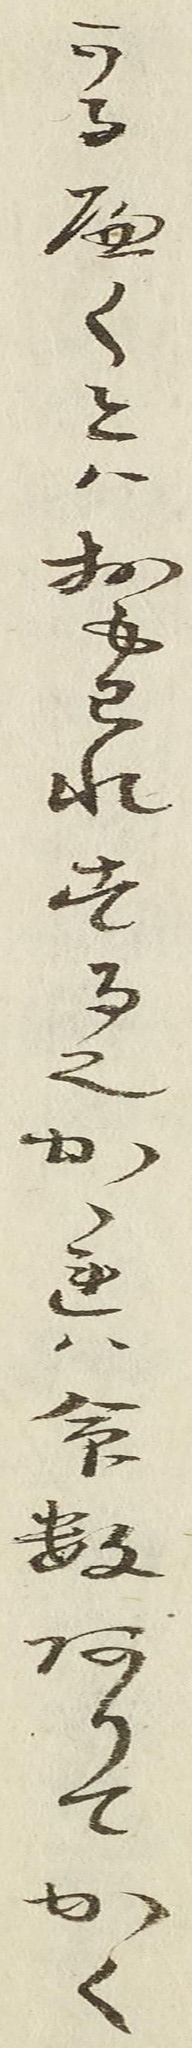かるへきとハおもわれする也かゝれハ命数ありてかく
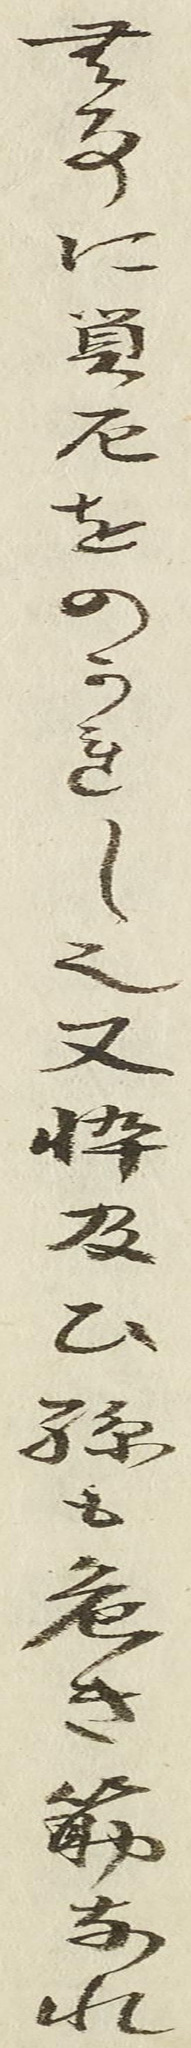無事に災厄をのかれし也又忰及ひ孫も危き筋なれ
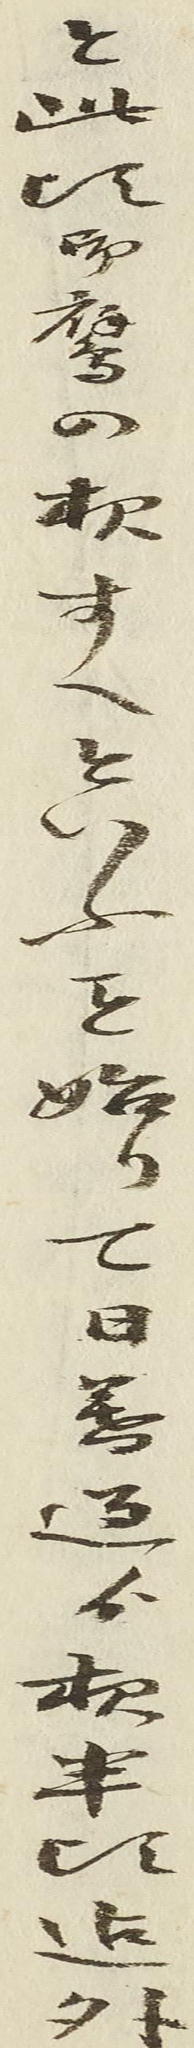と此頃御鷹の夜すへといふを始りて日暮過ゟ夜半頃迄外
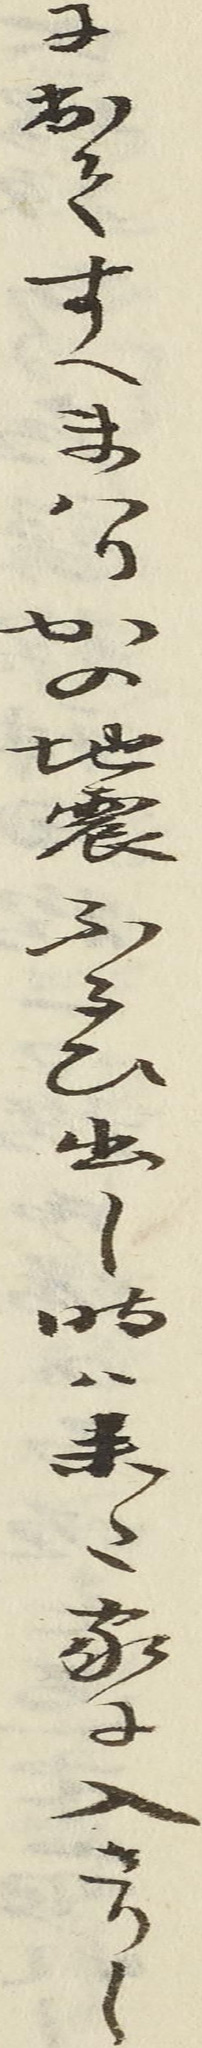に出てすへまハりかの地震ふるひ出し時ハ未た家に入さりし
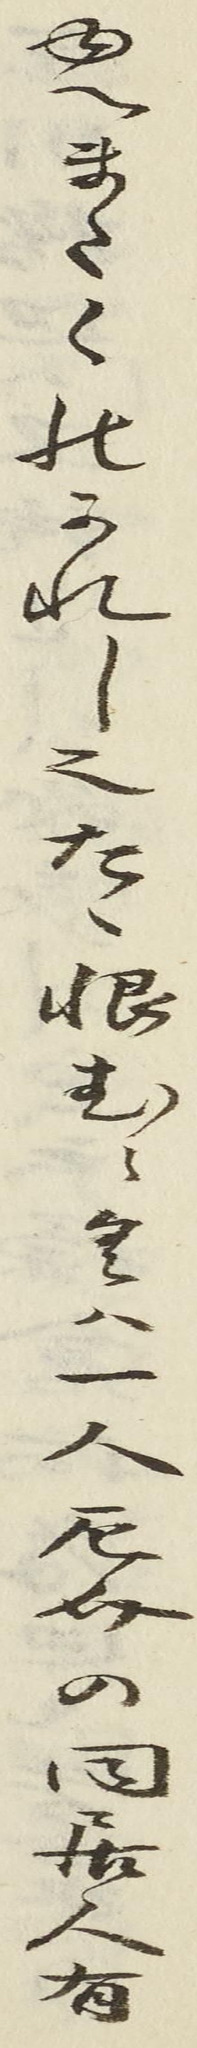ゆへまたのかれし也たゝ恨むしくハ一人厄介の同居人有
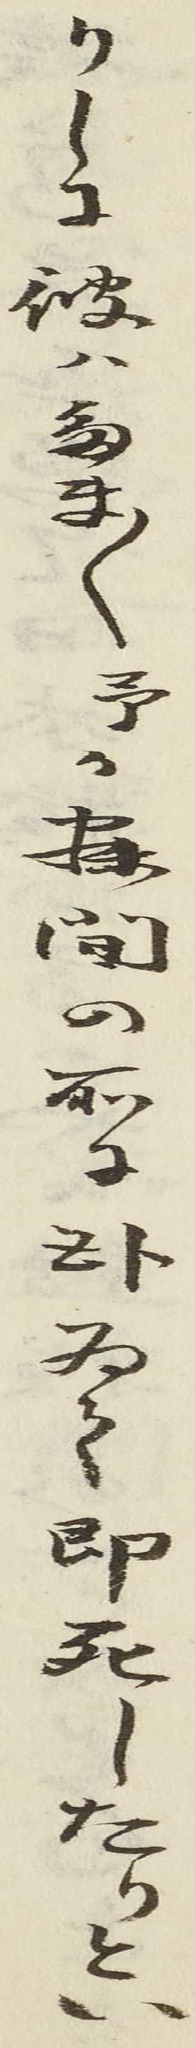りしに彼はたま〳〵予か寝間の所に臥ゐて即死したりとい
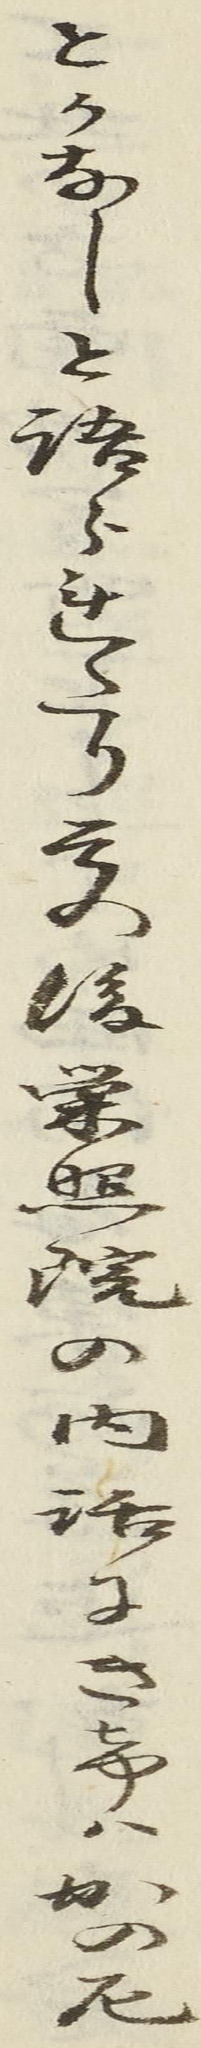とかなしと語られたりその後栄照院の内話にきけハかの厄
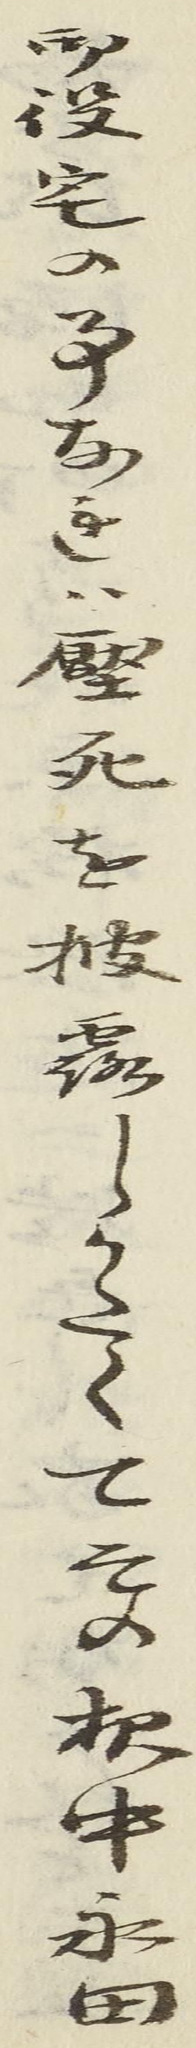御役宅の事なれハ圧死を披露しかたくてその夜中永田
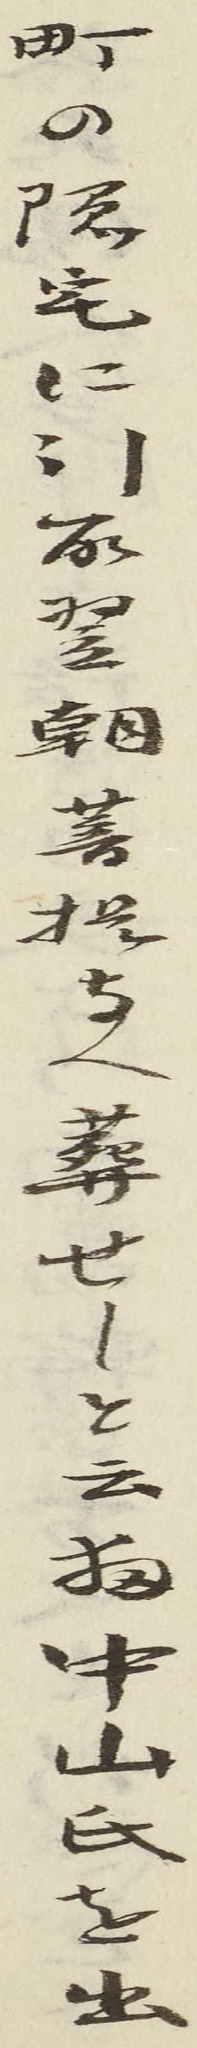町の隠宅に引取翌朝菩提寺へ葬せしと云猶中山氏を出
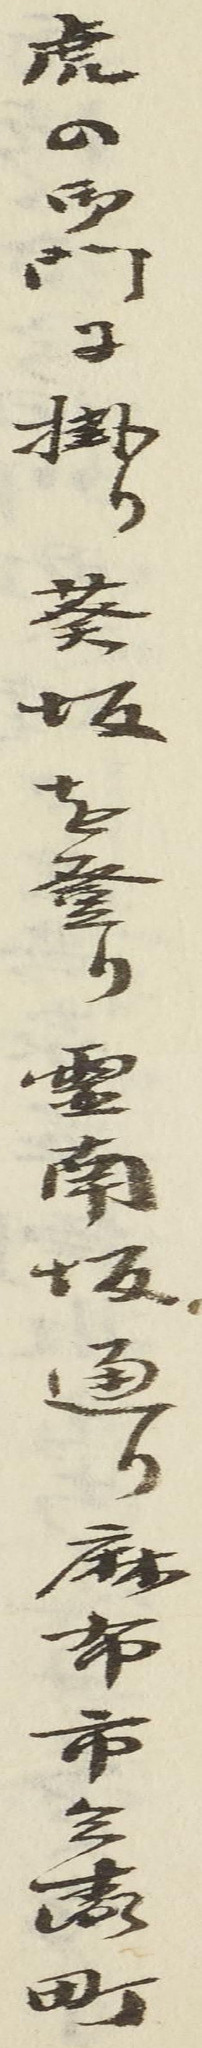虎の御門に掛り葵坂を登り霊南坂通り麻布市兵衛町
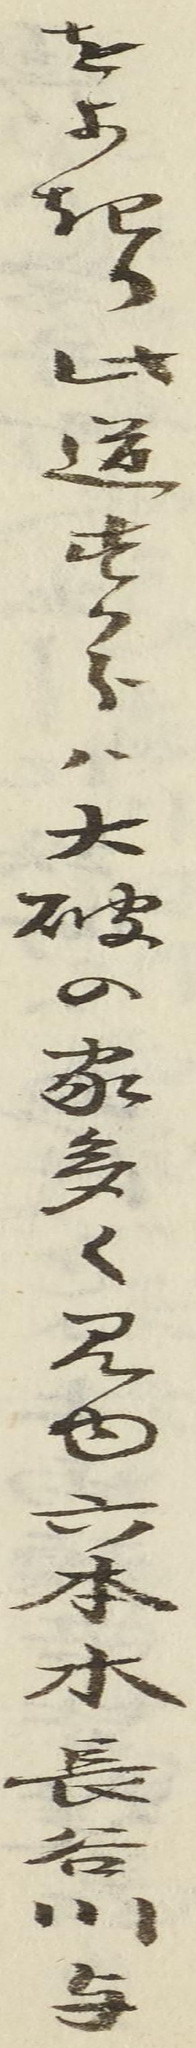をよきり此道すからハ大破の家多く見ゆ六本木長谷川与
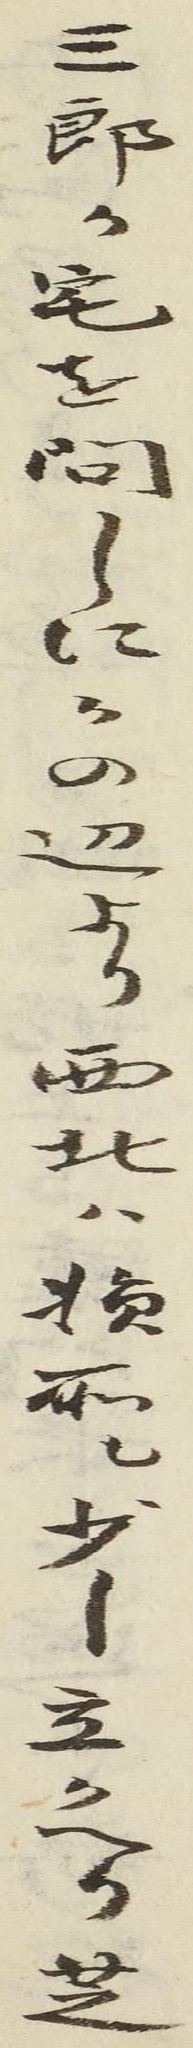三郎か宅を問しにかの辺より西北ハ損所少し立かへり柴

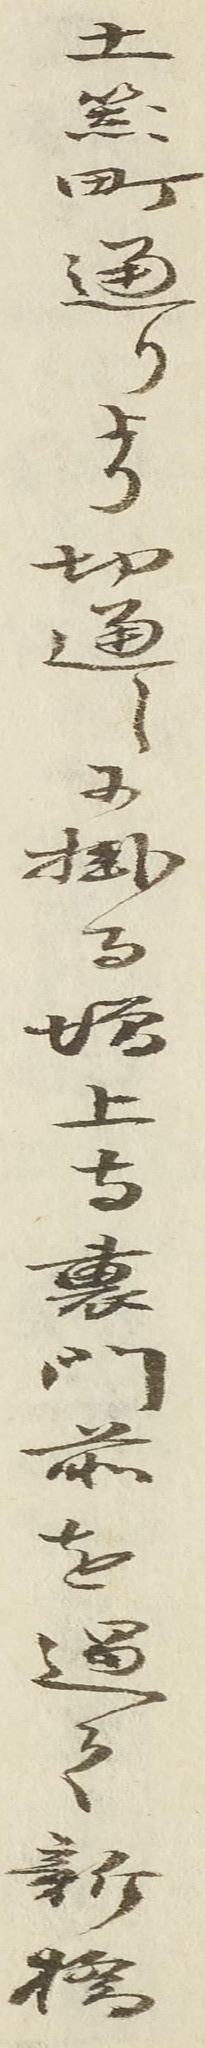土釜町通りより切通しに掛ける増上寺裏門前を過て新橋
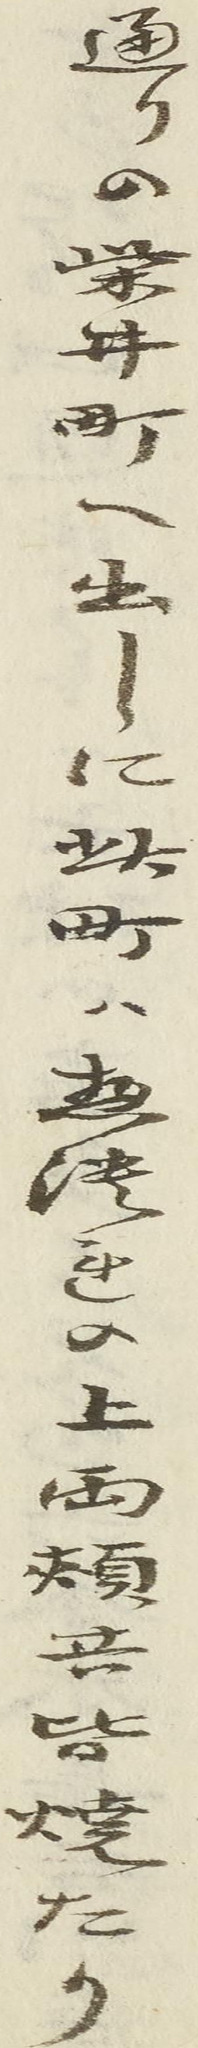通りの柴井町へ出しに此町ハ惣潰れの上兩頬共皆焼たり
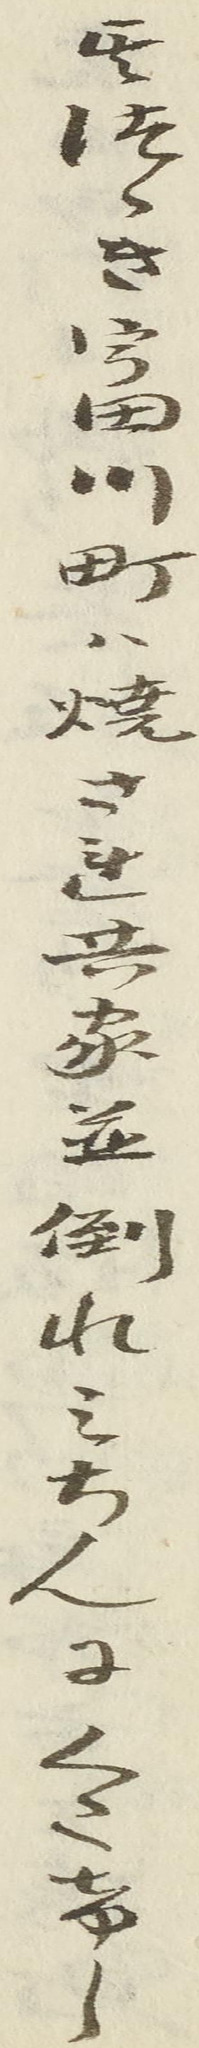其つゝき宇田川町ハ焼され共家並倒れミちんにくたけし
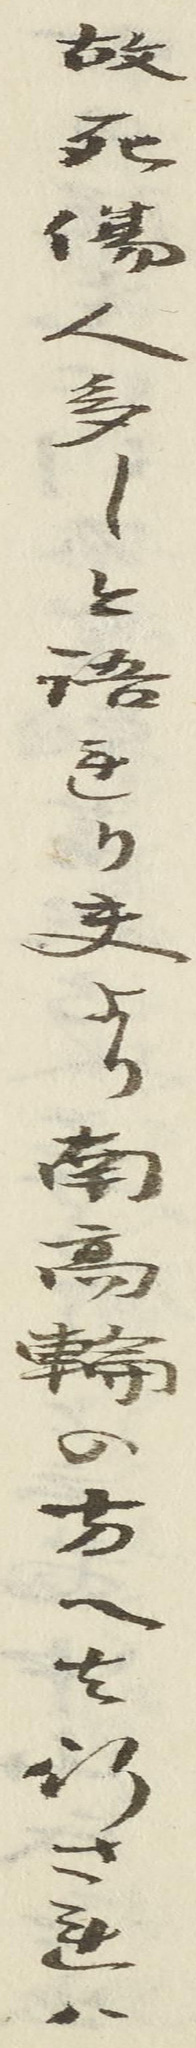故死傷人多しと語れり夫より南高輪の方へは行されハ
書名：那為の後見艸　全
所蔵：東京大学地震研究所図書室 Earthquake Research Institute Library, The University of Tokyo, JAPAN
